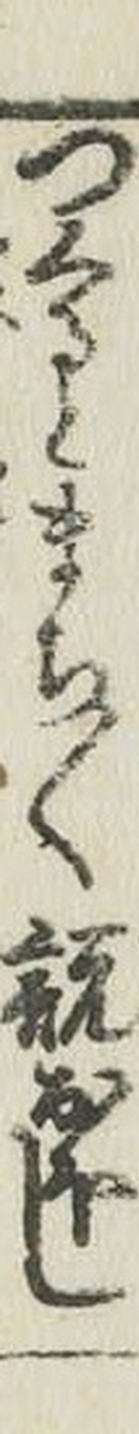つくるとまち〳〵説おほし
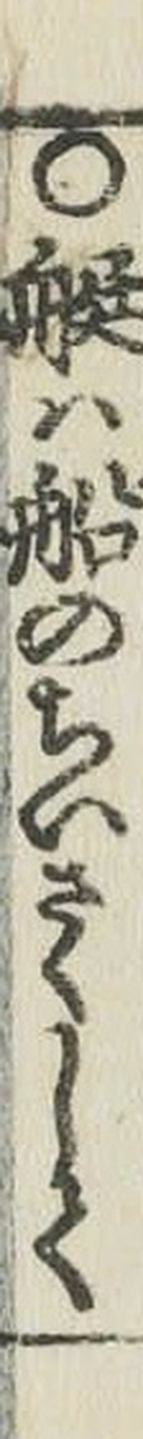○艇は船のちいさくして
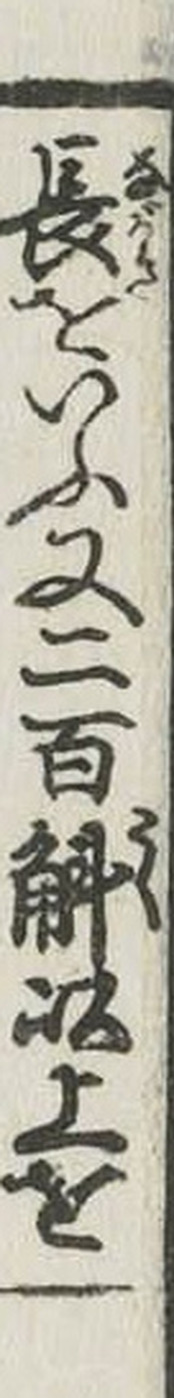長をいふ又二百斛以上を
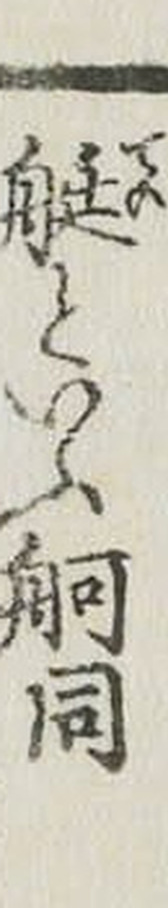艇といふ舸同
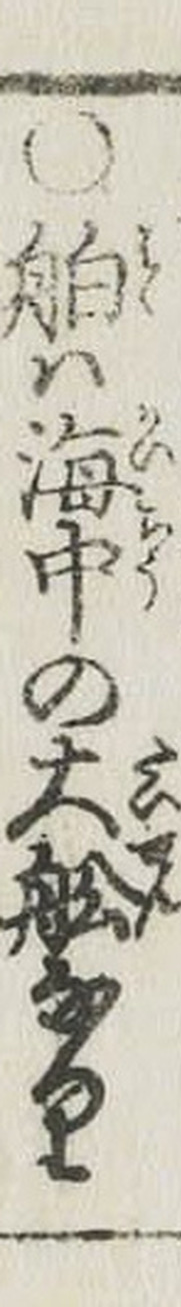○舶は海中の大舩なり
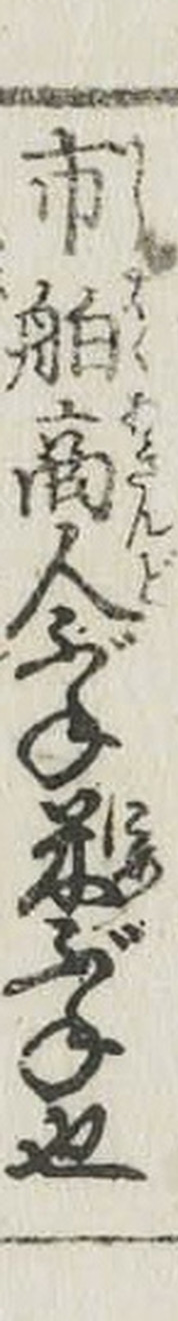市舶商人ぶね米ぶね也
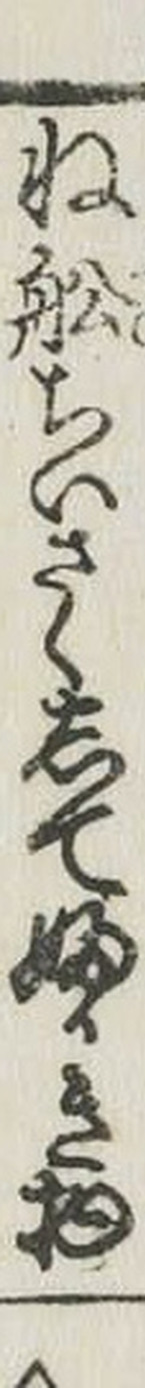ね舩ちいさくしてふかき物
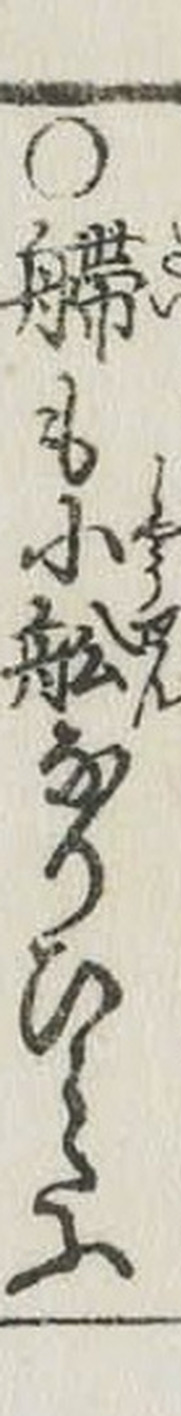○艜も小舩なりひらたふ
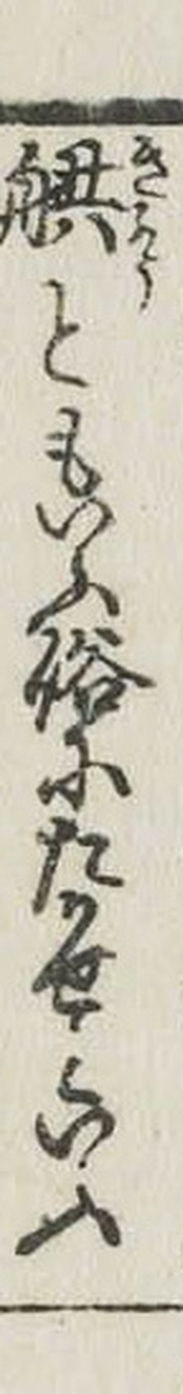舼ともいふ俗にたかせといふ
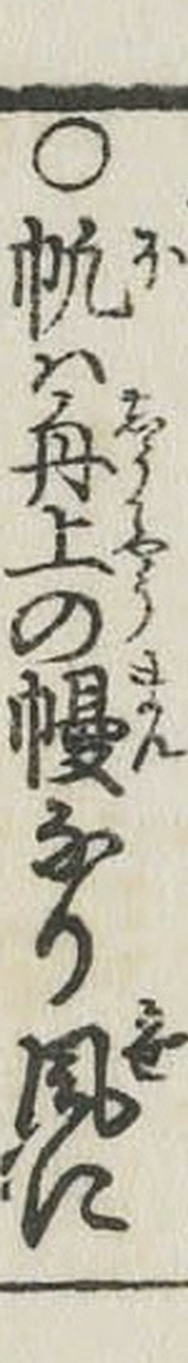○帆は舟上の幔なり風に
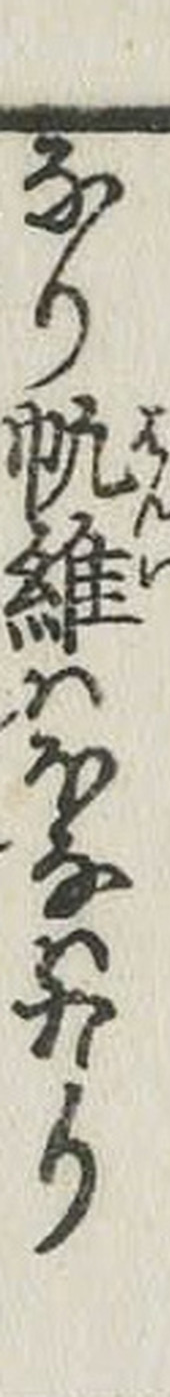なり帆維はほなはなり
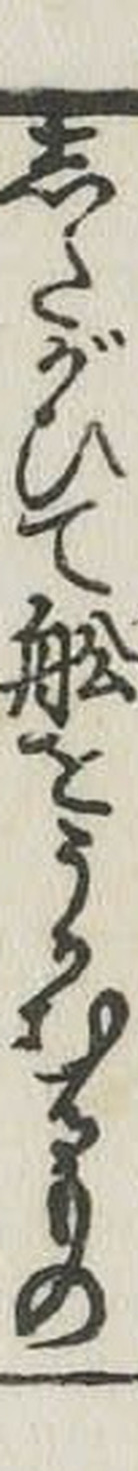したがひて舩をうかむるもの
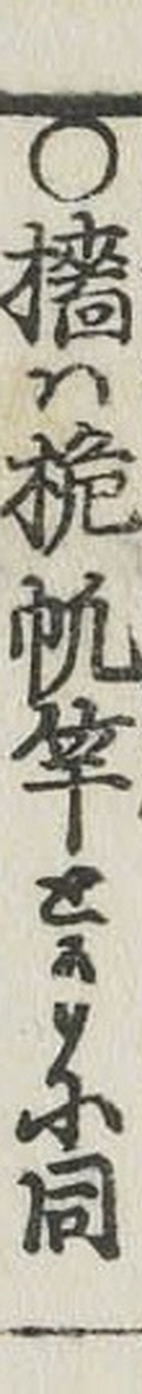○檣は桅帆竿ともに同
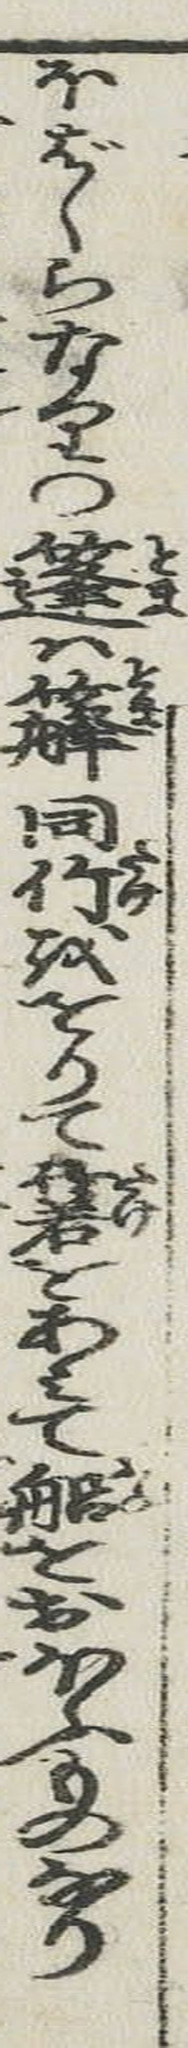ほばしらなり○篷は𥴣同竹をとりて箬をあみて船をおほふものなり
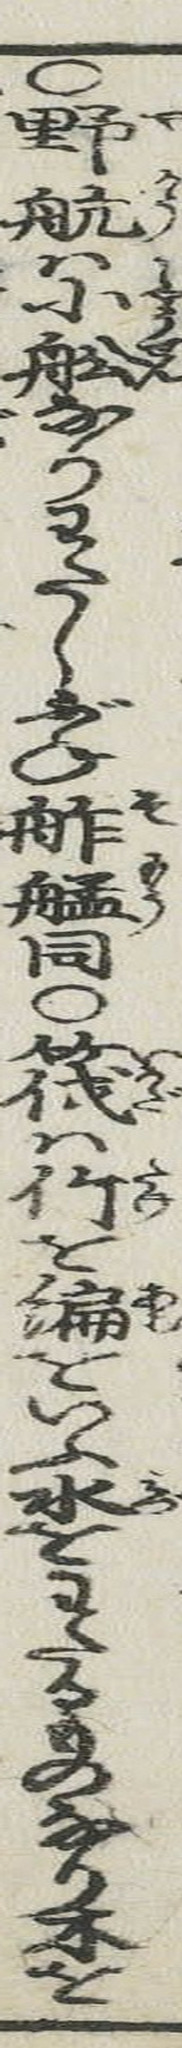○野航は小舩なりわたしぶね舴艋同○筏は竹を編をいふ水をわたるものなり木を
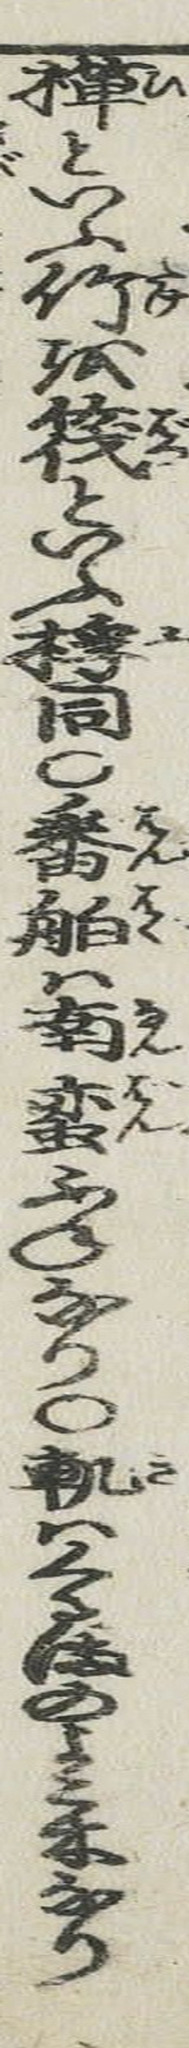▢といふ竹を筏といふう桴同○番舶は南蛮ふねなり○䡄はくるまのよこ木なり
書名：増補頭書訓蒙図彙大成 10巻 5:巻之9-11
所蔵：東京学芸大学教育コンテンツアーカイブ
